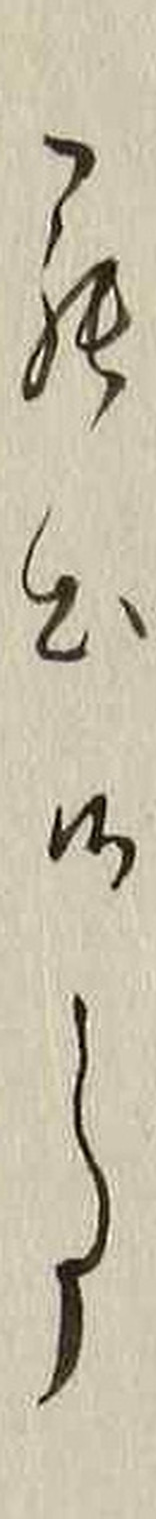罷出候事
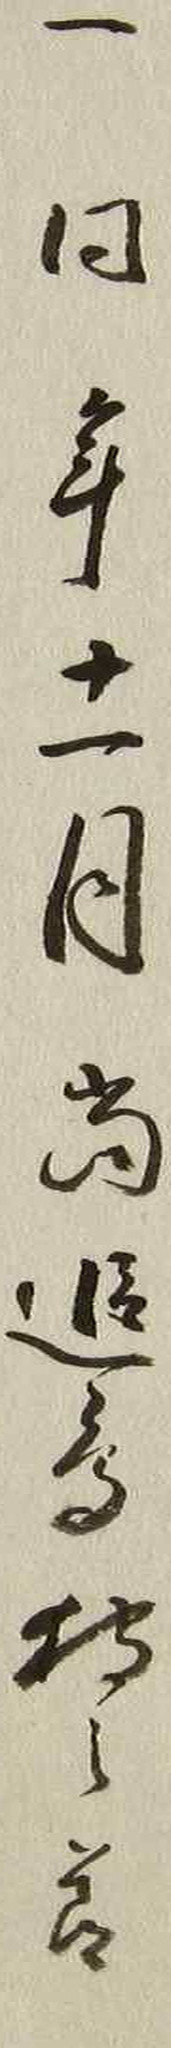一同年十一月当追鳥狩之節
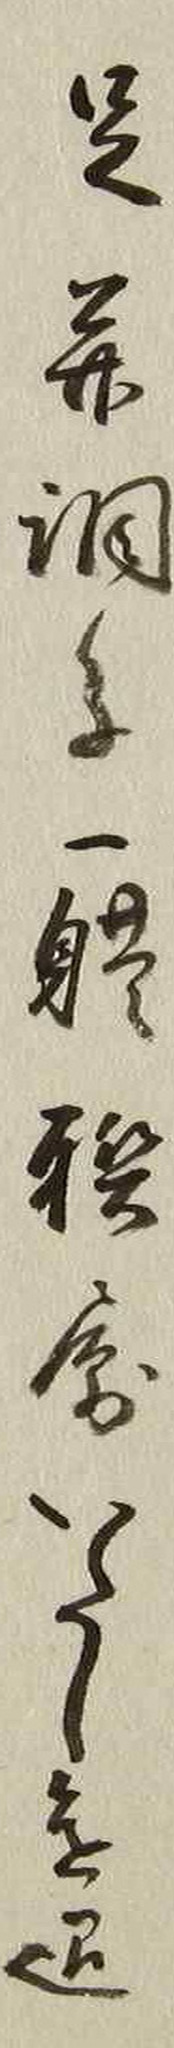足并調子一体聯属いたし進退
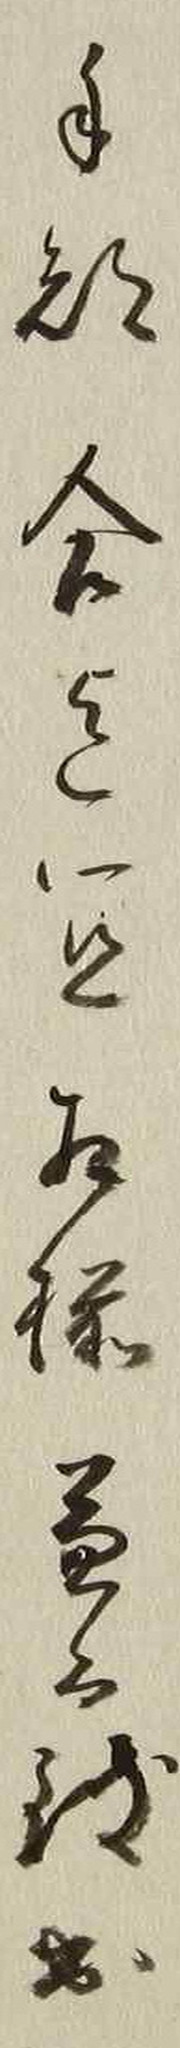手都合迄宜相揃兼而致出
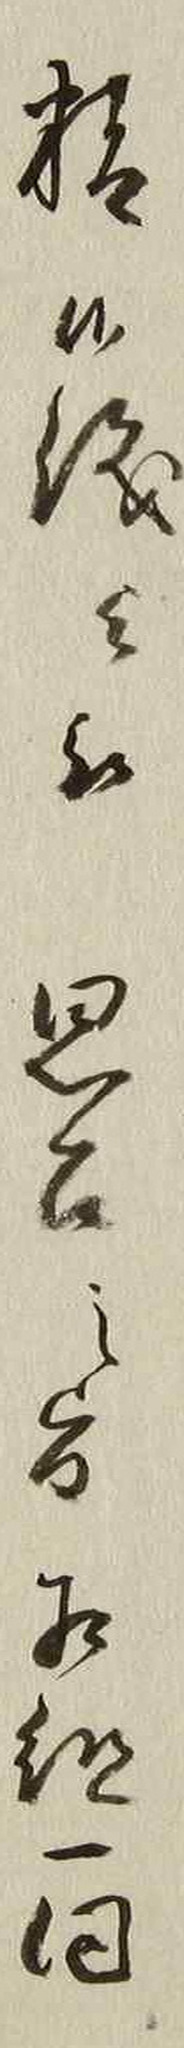精候儀と被思召之旨相組一同
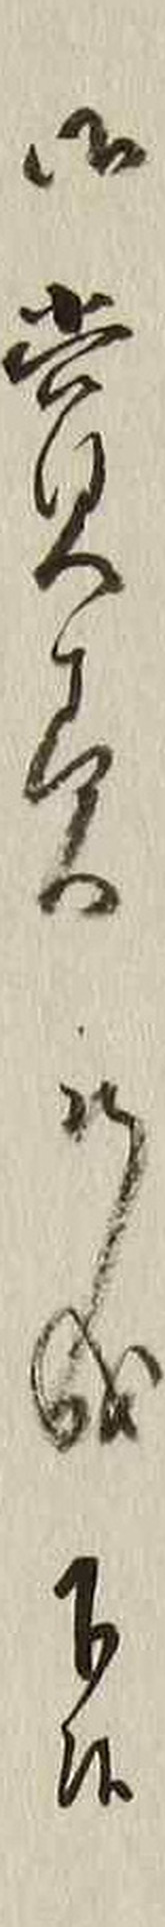御賞美被成下候
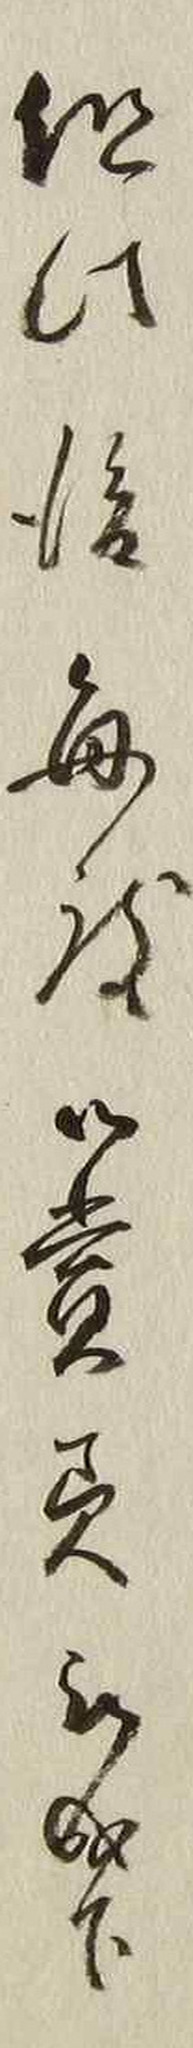但此後毎度御賞美被成下
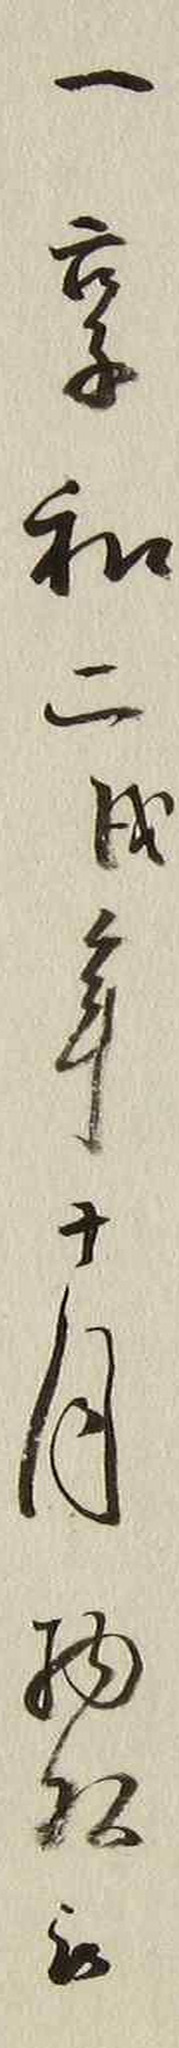一享和二戌年十月物頭被
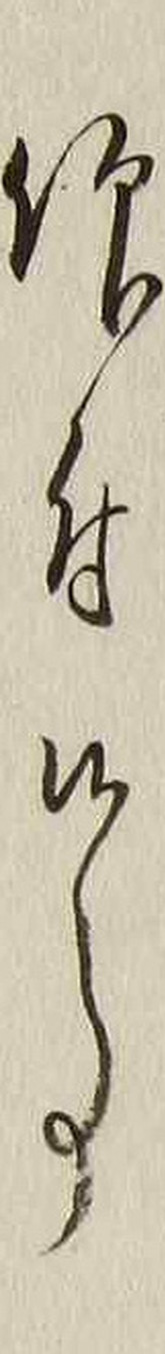仰付候事
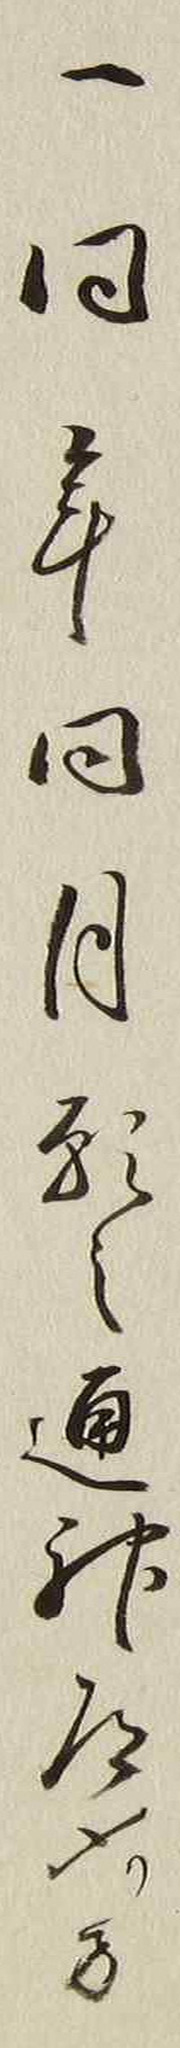一同年同月願之通神道〆り方
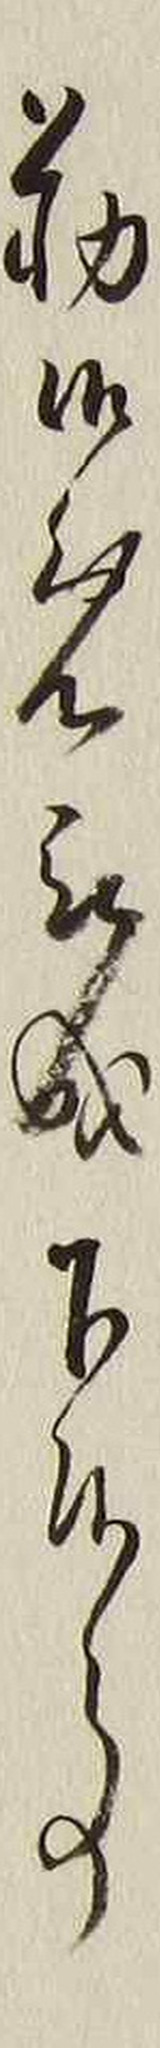勤御免被成下候事
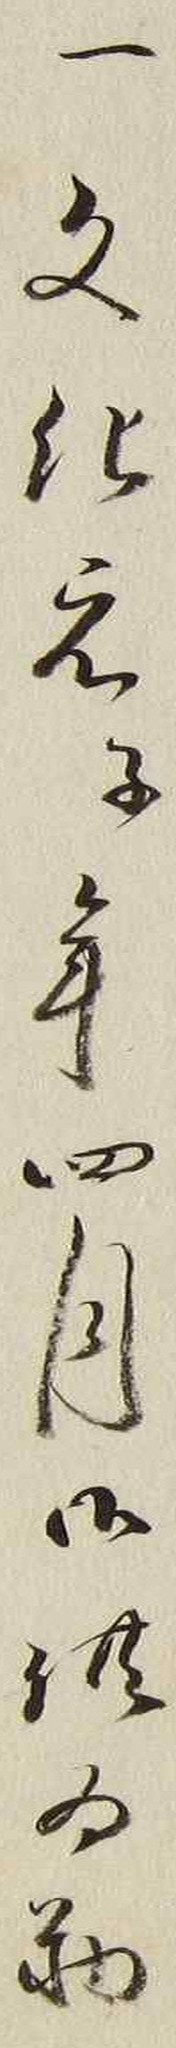一文化元子年四月御供為勤
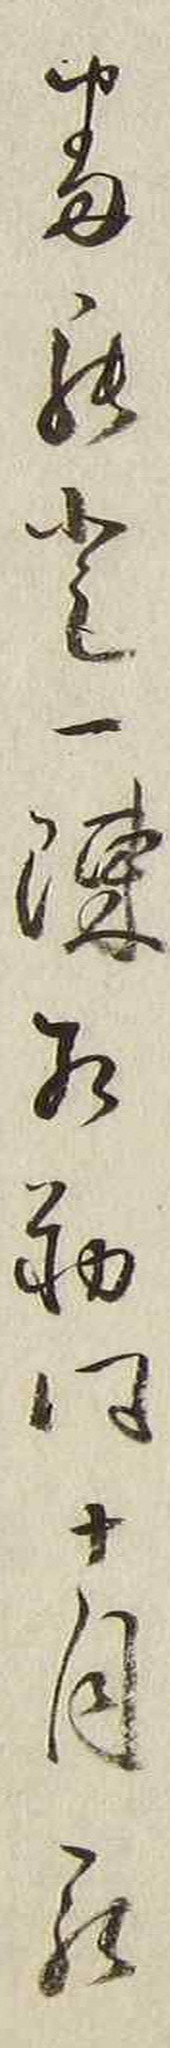番罷登一陣相勤同十月罷

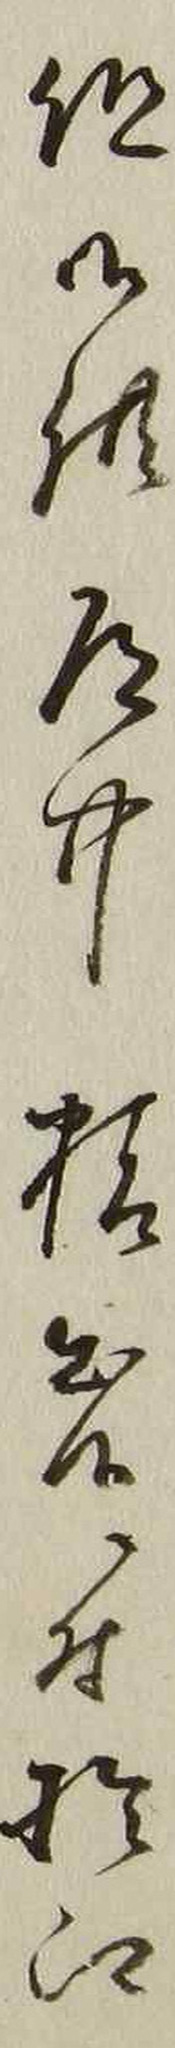但御供道中精出候に付於江
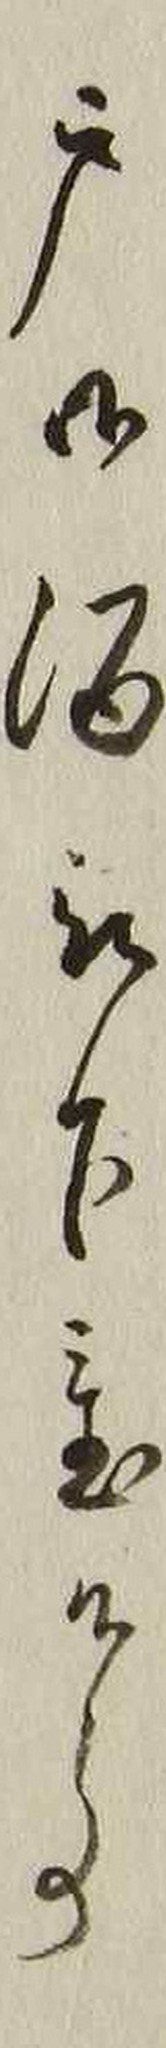戸御酒被下置候事
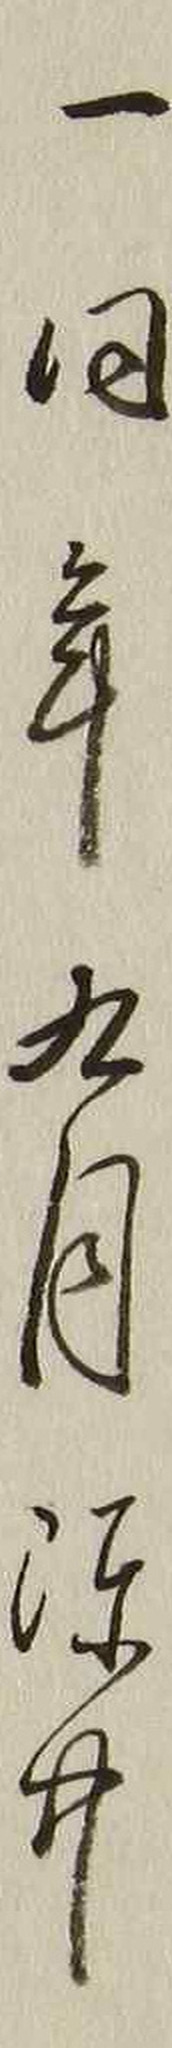一同年九月陣中
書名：諸士系譜　巻之159　な之部1
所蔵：会津若松市立会津図書館
